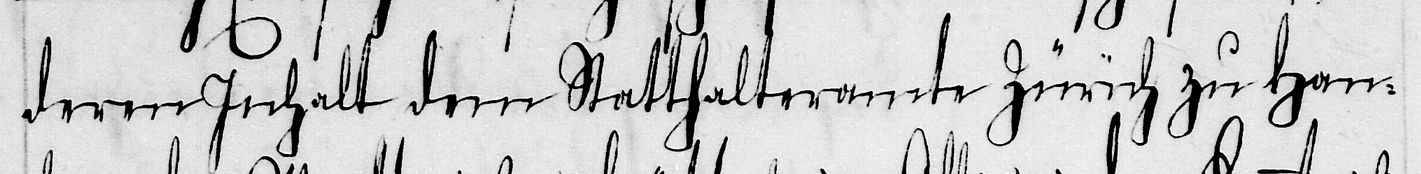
deren Inhalt dem Statthalteramte Zürich zu Han¬
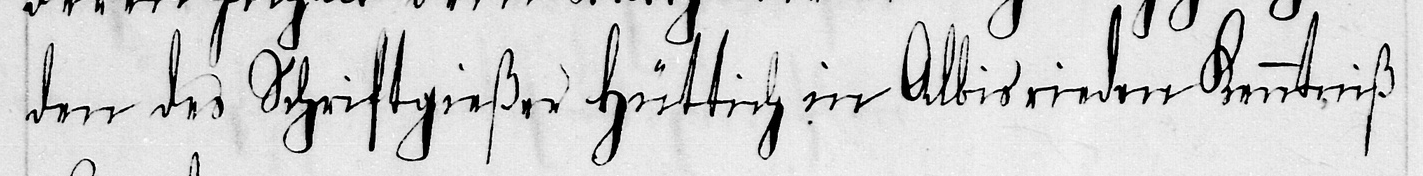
den des Schriftgießer Hüttich in Albisrieden Kenntniß
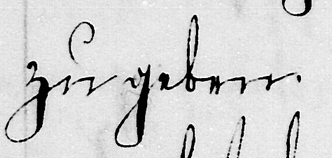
zu geben.
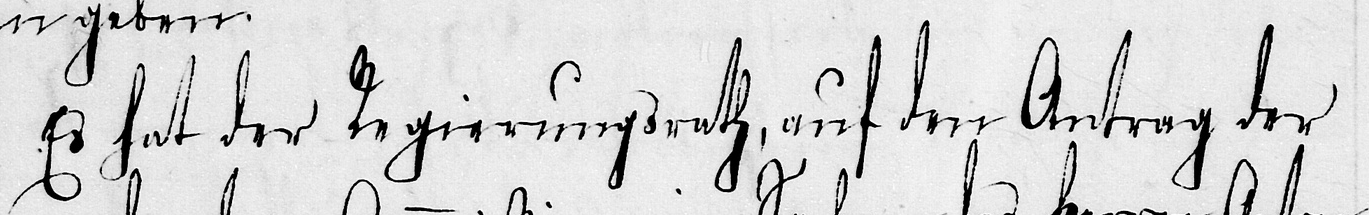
Es hat der Regierungsrath, auf den Antrag der
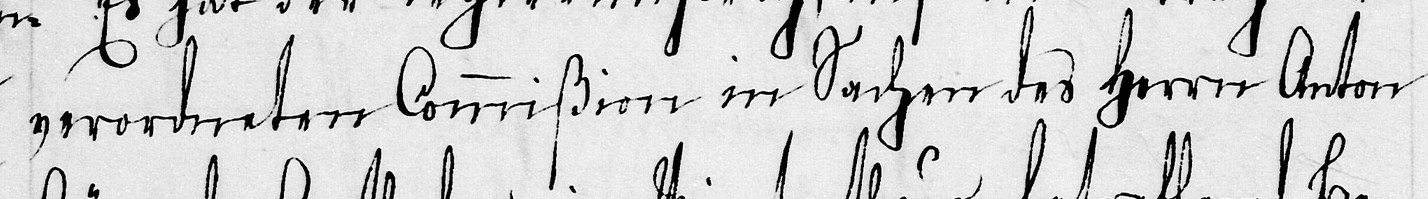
verordneten Commißion in Sachen des Herrn Anton
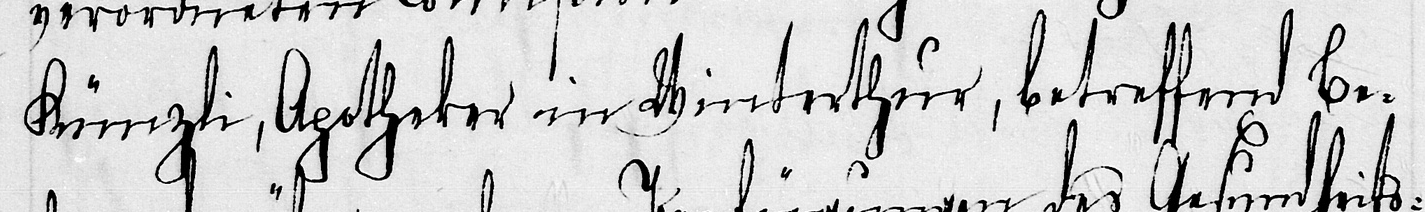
Künzli, Apotheker in Winterthur, betreffend Be¬
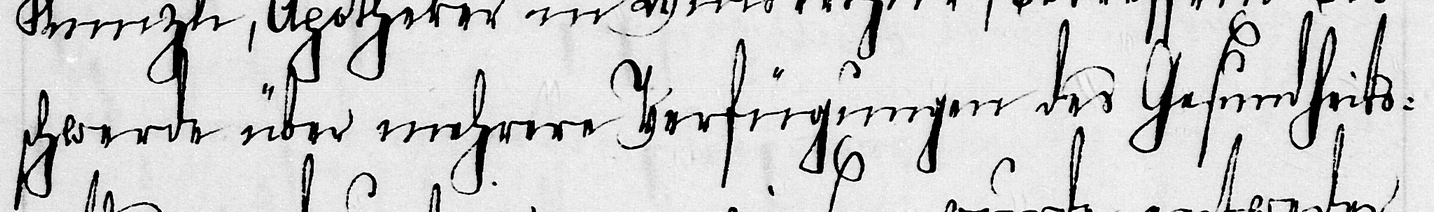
schwerde über mehrere Verfügungen des Gesundheits¬
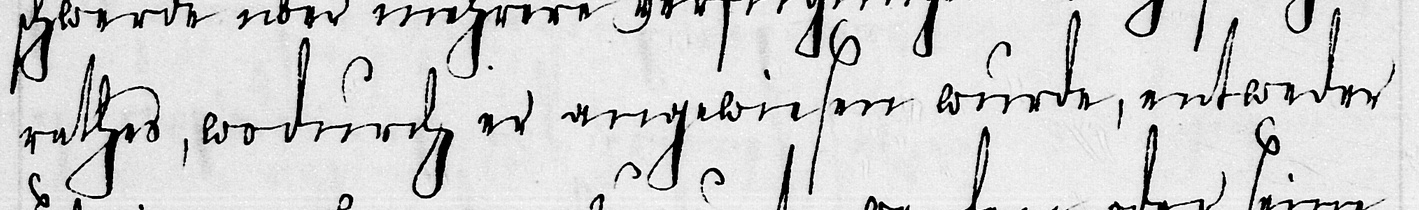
rathes, wodurch er angewiesen wurde, entweder
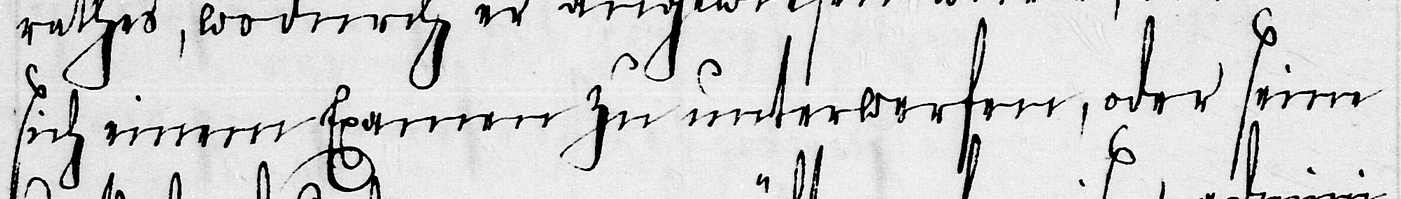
sich einem Examen zu unterwerfen, oder seine
